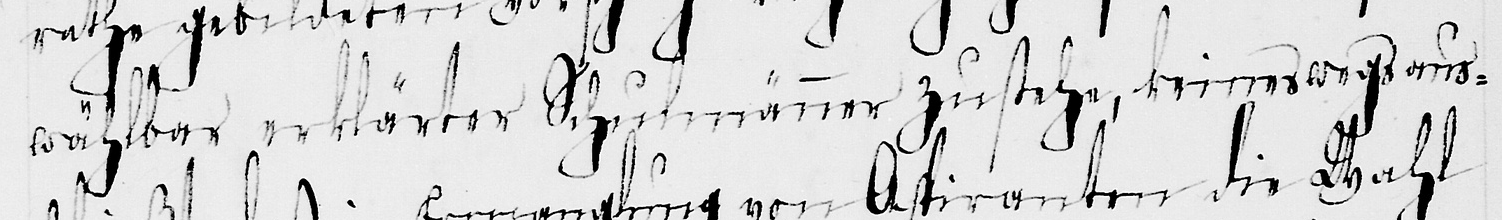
wählbar erklärter Schulmänner zustehe, keineswegs aus¬
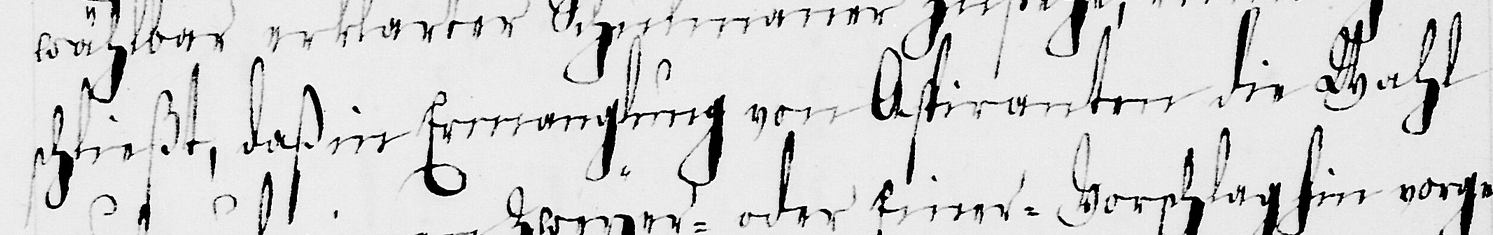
schließt, daß in Ermangelung von Aspiranten die Wahl
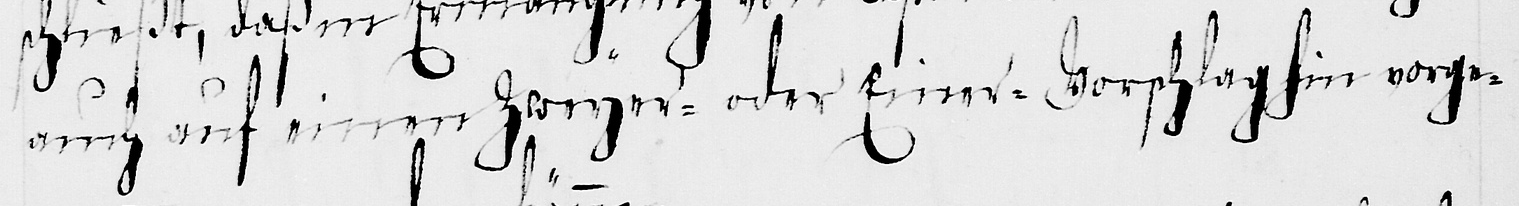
auch auf einen Zweyer- oder Einer-Vorschlag hin vorge¬
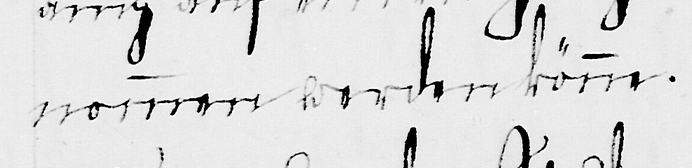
nommen werden könne.
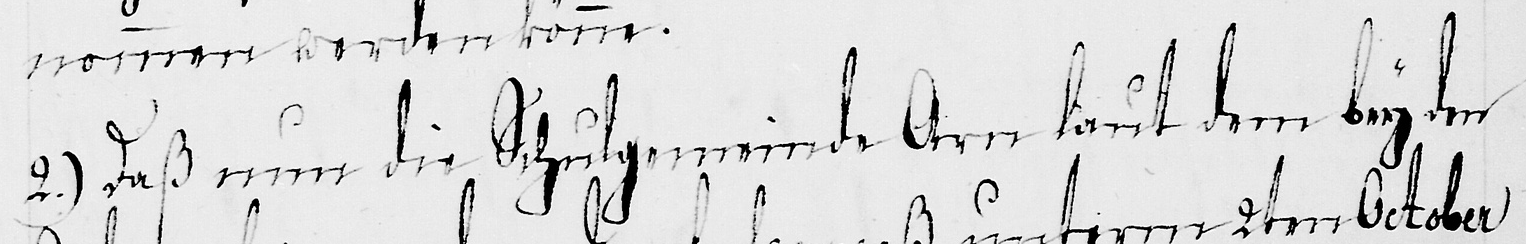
2.) Daß nun die Schulgemeinde Arn laut dem bey den
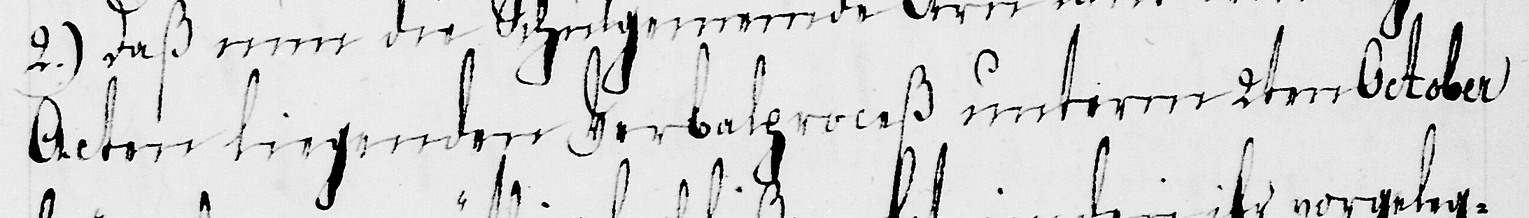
Acten liegenden Verbalproceß unterm 2ten October
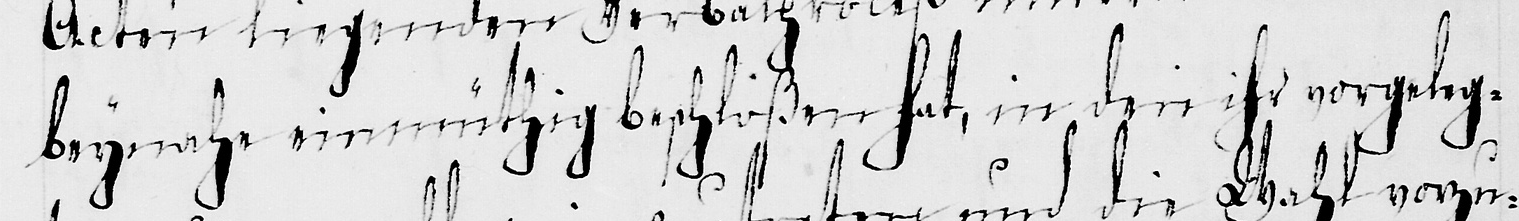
beynahe einmüthig beschloßen hat, in den ihr vorgeleg¬
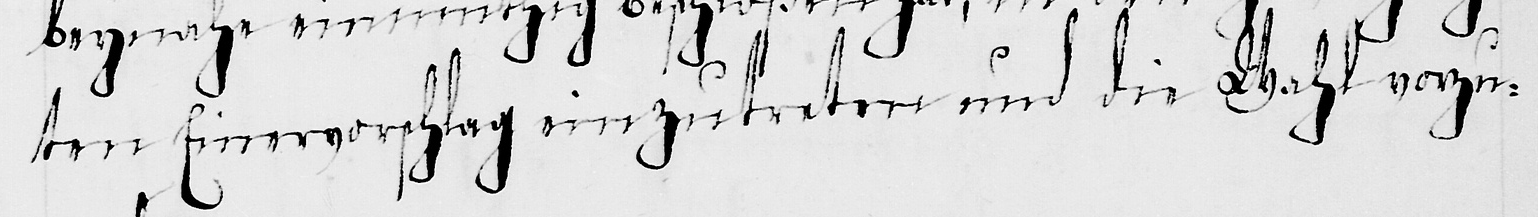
ten Einervorschlag einzutreten und die Wahl vorzu¬
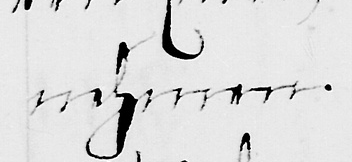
nehmen.
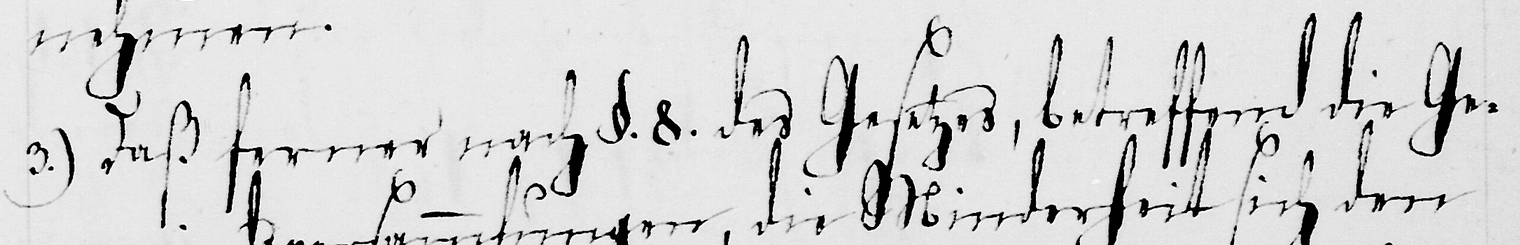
3.) Daß ferner nach §. 8. des Gesetzes, betreffend die Ge¬
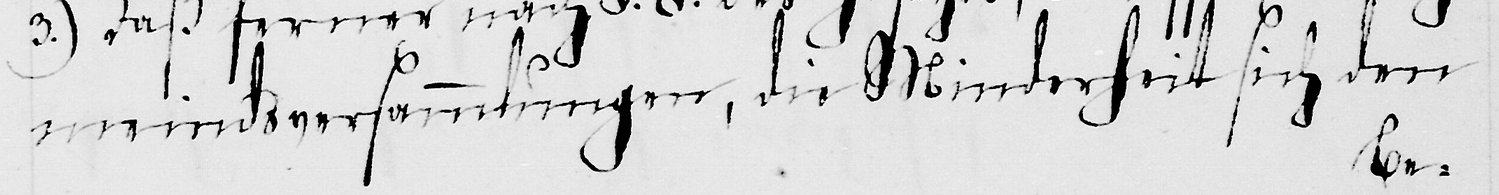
meindsversammlungen, die Minderheit sich den
